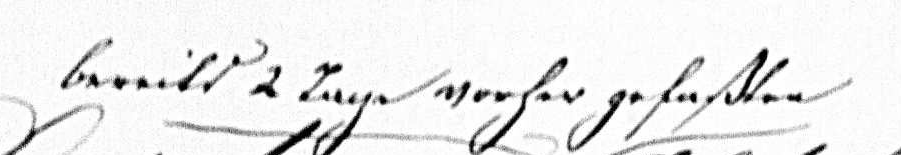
bereits 2 Tage vorher gefaßten
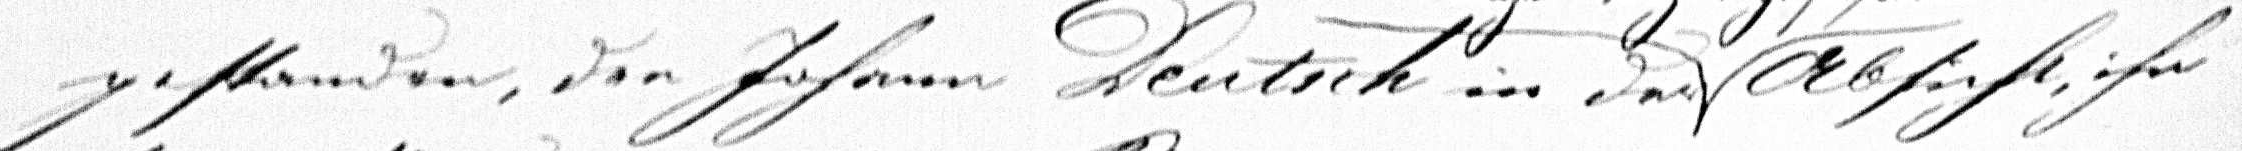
gestanden, den Johann Deutsch in der Absicht, ihn
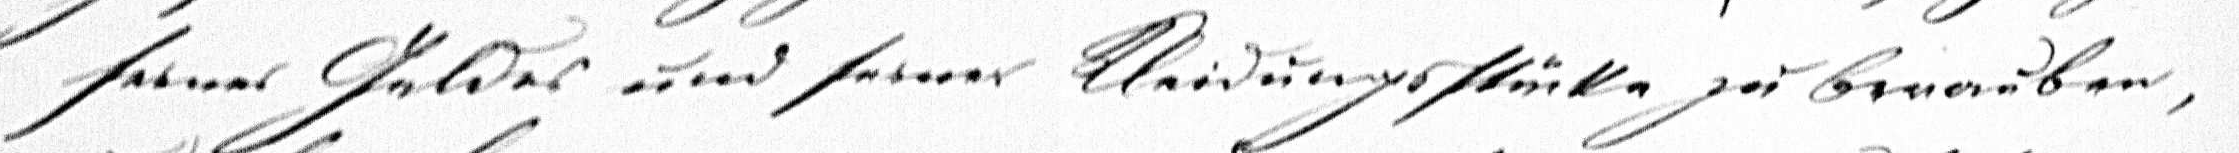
seines Geldes und seiner Kleidungsstücke zu berauben,
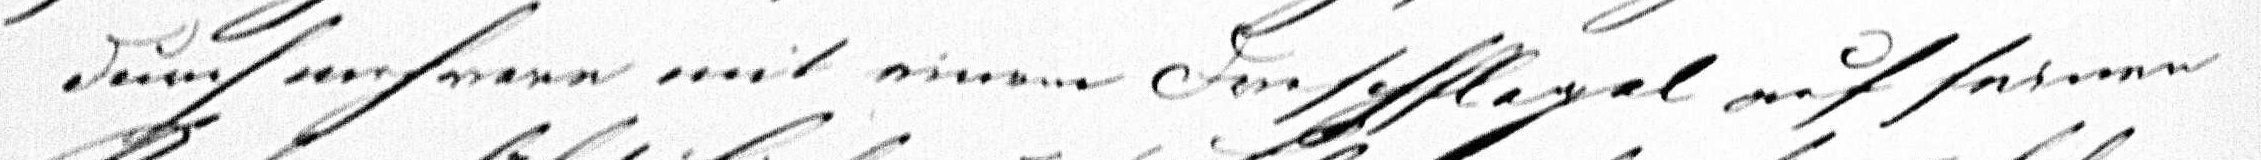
durch mehrere mit einem Dorschflegel auf seinen
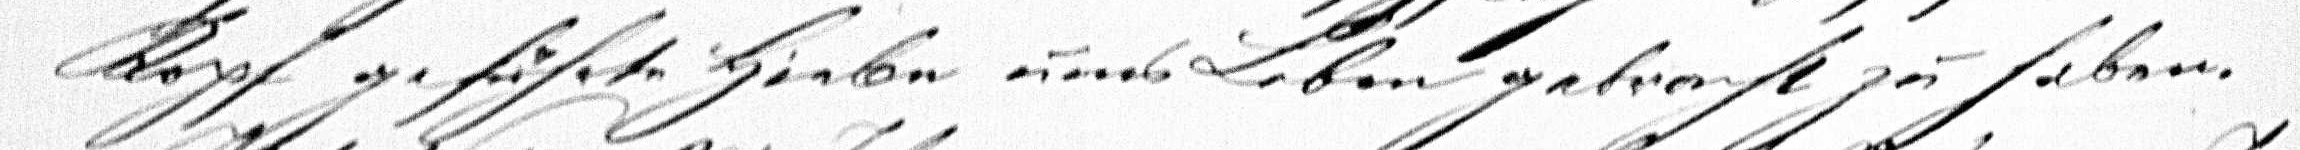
Kopf geführte Hiebe ums Leben gebracht zu haben.
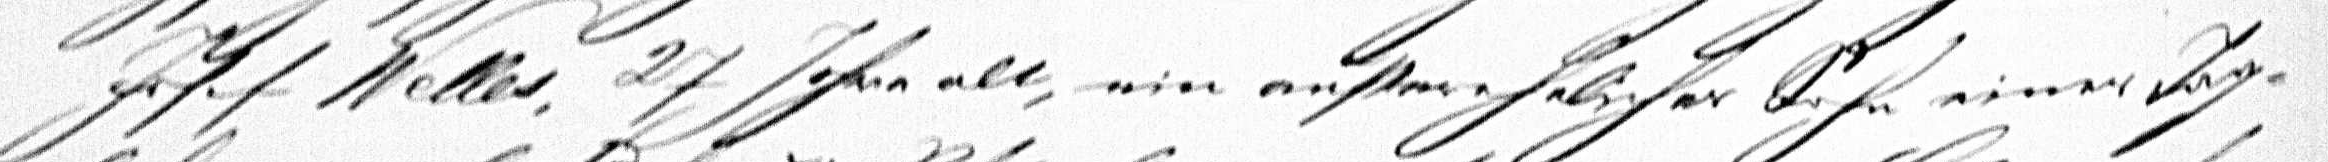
Josef Welles, 27 Jahre alt, ein außerehelicher Sohn eines Tag¬
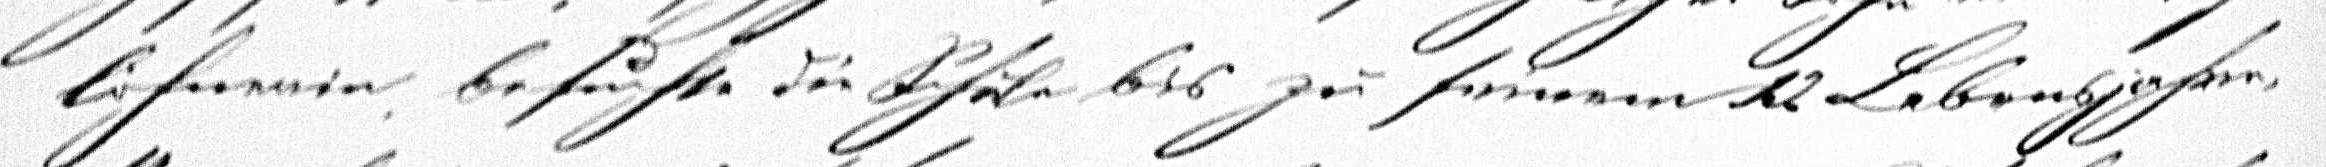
löhnerin, besuchte die Schule bis zu seinem 22 Lebensjahre,
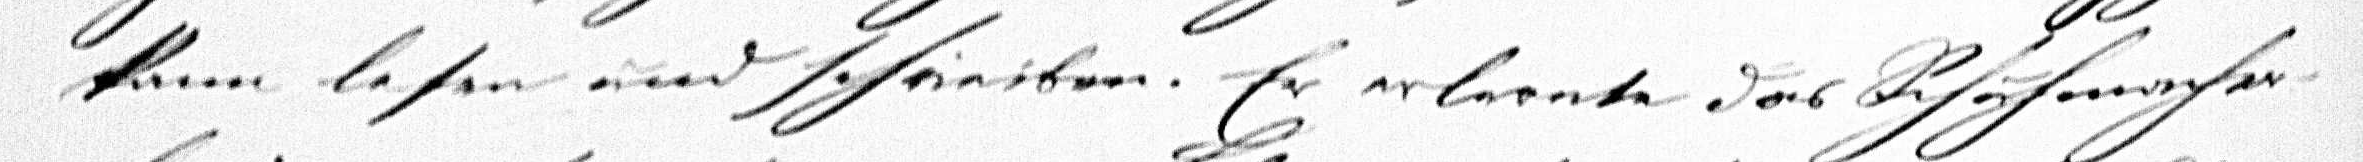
kann lesen und schreiben. Er erlernte das Schuhmacher¬
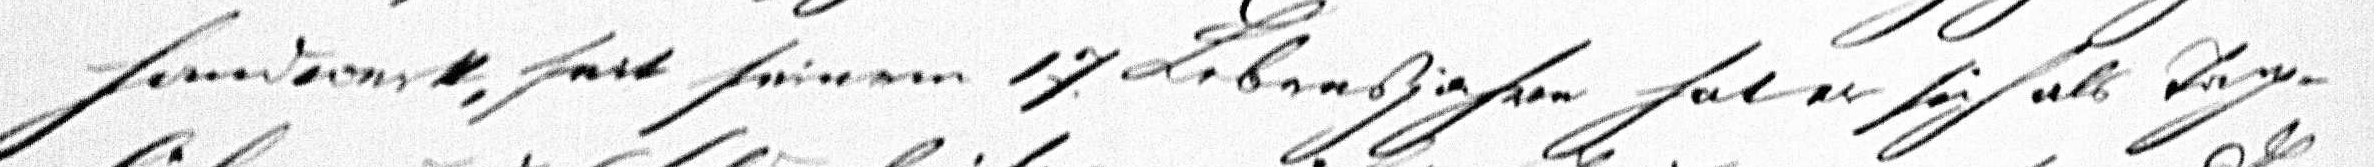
handwerk, seit seinem 17. Lebensjahren hat er sich als Tag¬
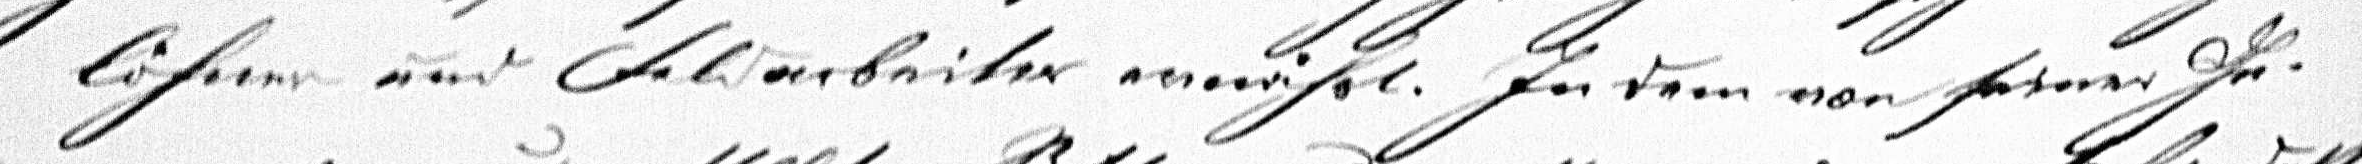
löhner und Feldarbeiter ernährt. In dem von seiner Ge¬
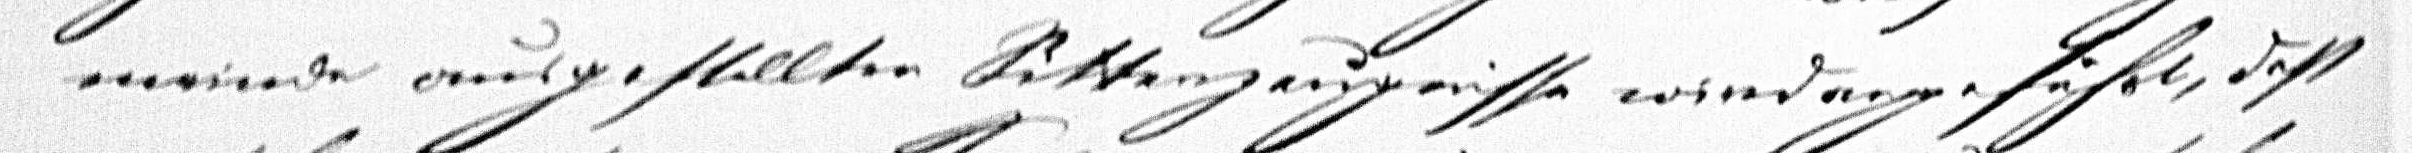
meinde ausgestellter Sittenzeugnisse wird angeführt, daß
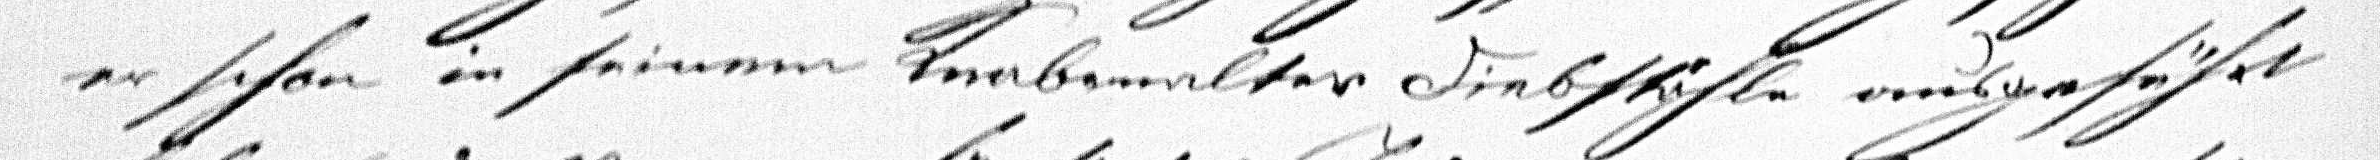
er schon in seinem Knabenalter Diebstähle ausgeführt
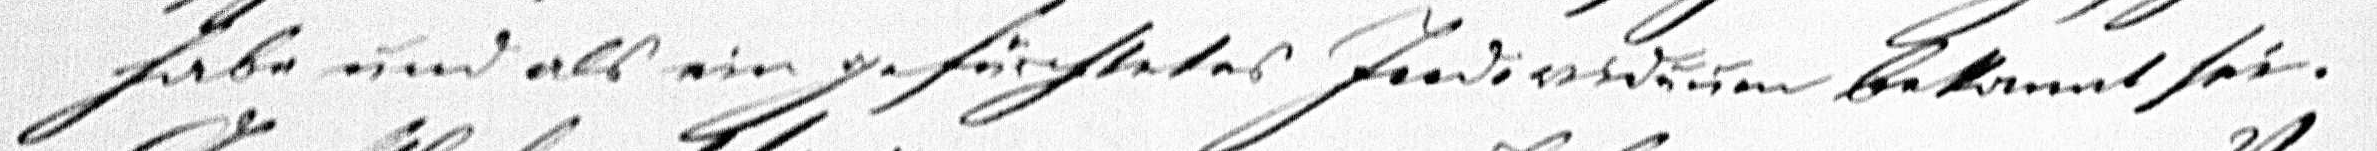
habe und als ein gefürchtetes Individuum bekannt sei.
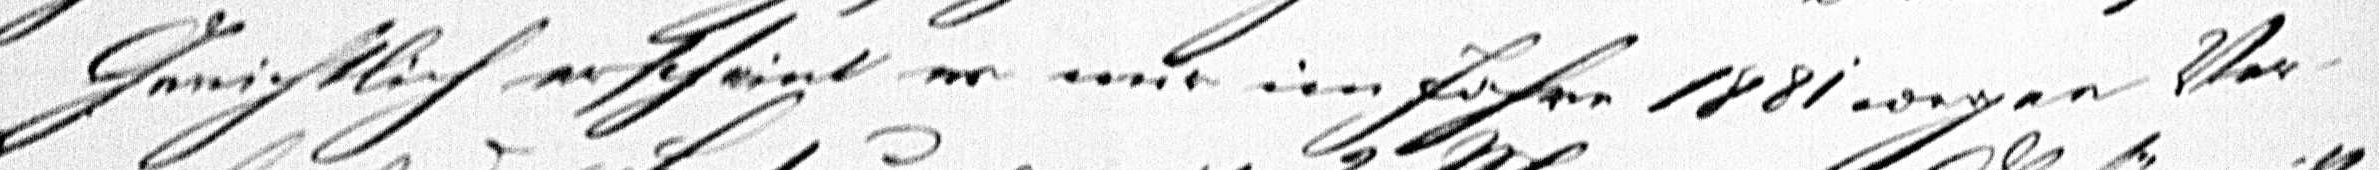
Gerichtlich erscheint er nur im Jahre 1881 wegen Ver¬
